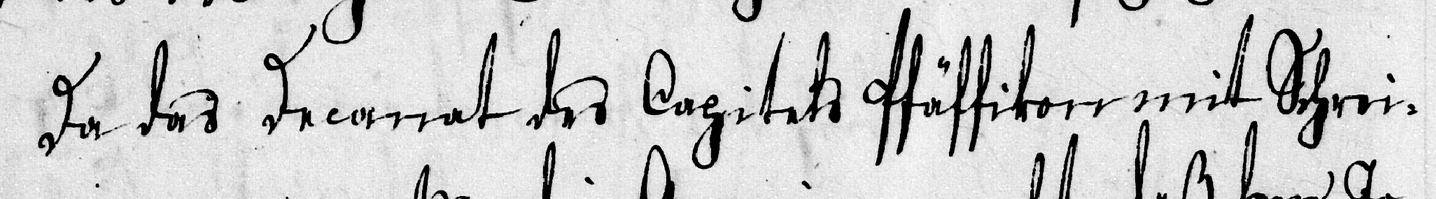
Da das Decanat des Capitels Pfäffikon mit Schrei¬
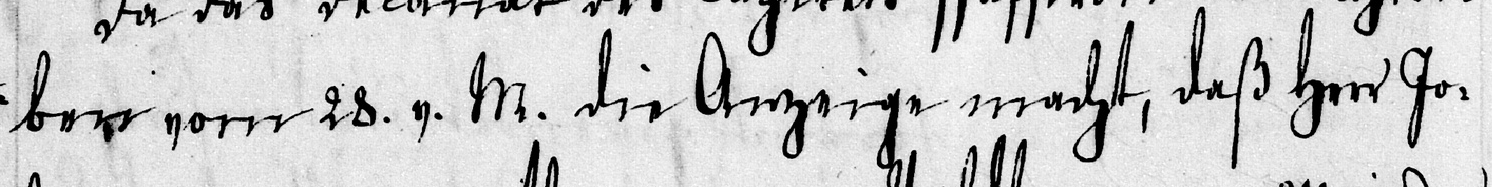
ben vom 28. v. M. die Anzeige macht, daß Herr Jo¬
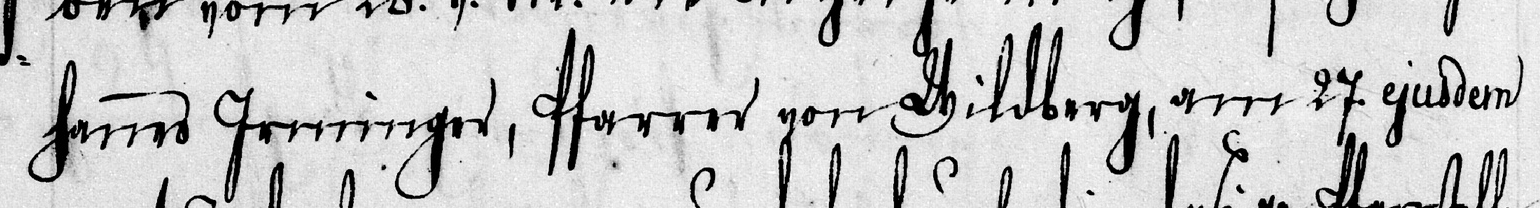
hannes Irminger, Pfarrer von Wildberg, am 27. ejusdem
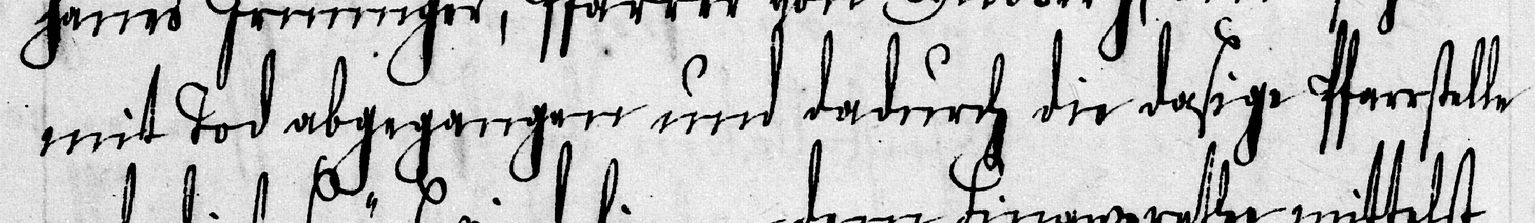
mit Tod abgegangen und dadurch die dasige Pfarrst¬
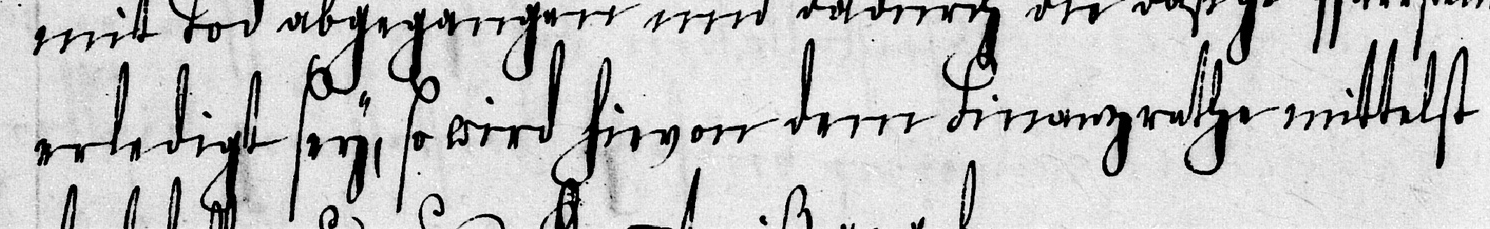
erledigt sey, so wird hievon dem Finanzrathe mittelst
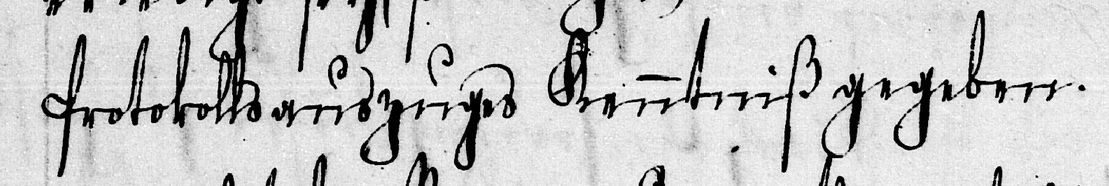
Protokollsauszuges Kenntniß gegeben.
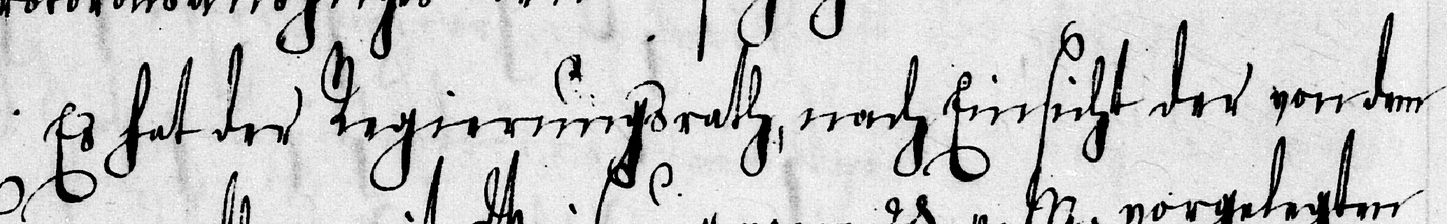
Es hat der Regierungsrath, nach Einsicht der von dem
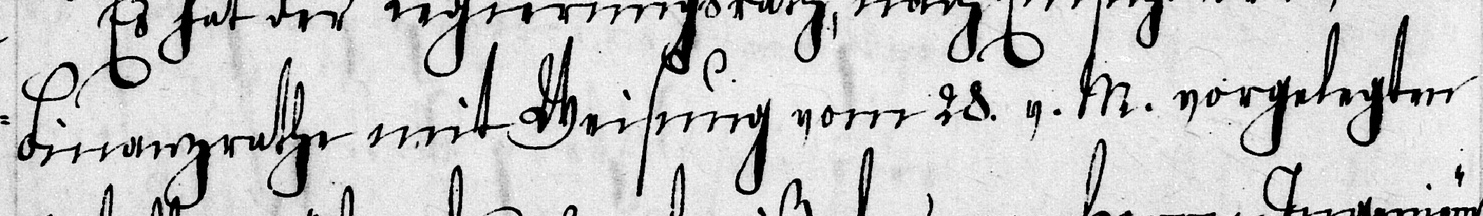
Finanzrathe mit Weisung vom 28. v. M. vorgelegten
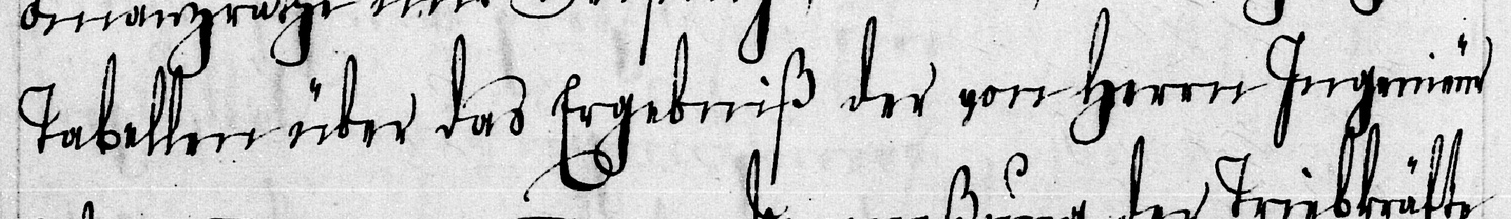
Tabellen über das Ergebniß der von Herrn Ingenieur
